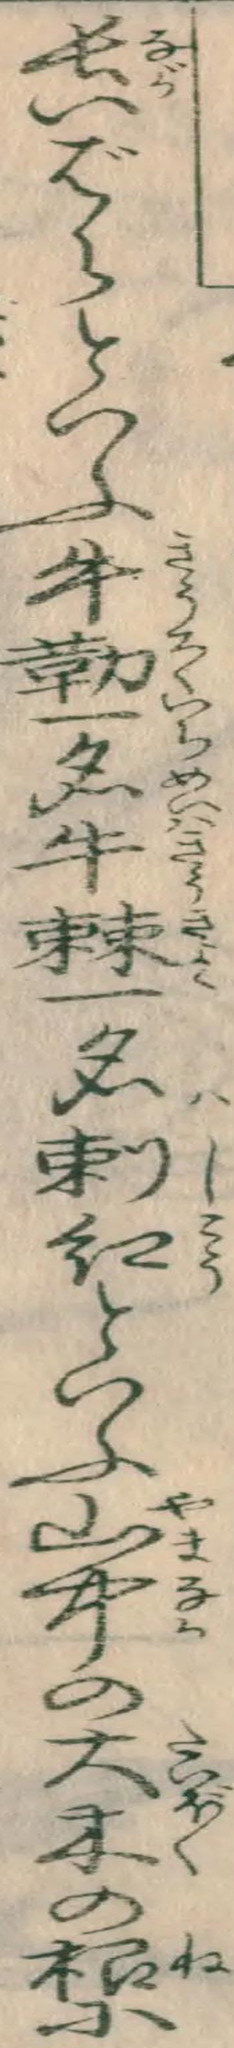長いばらといふ牛勒一名牛棘一名剌紅といふ山中の大木の根に
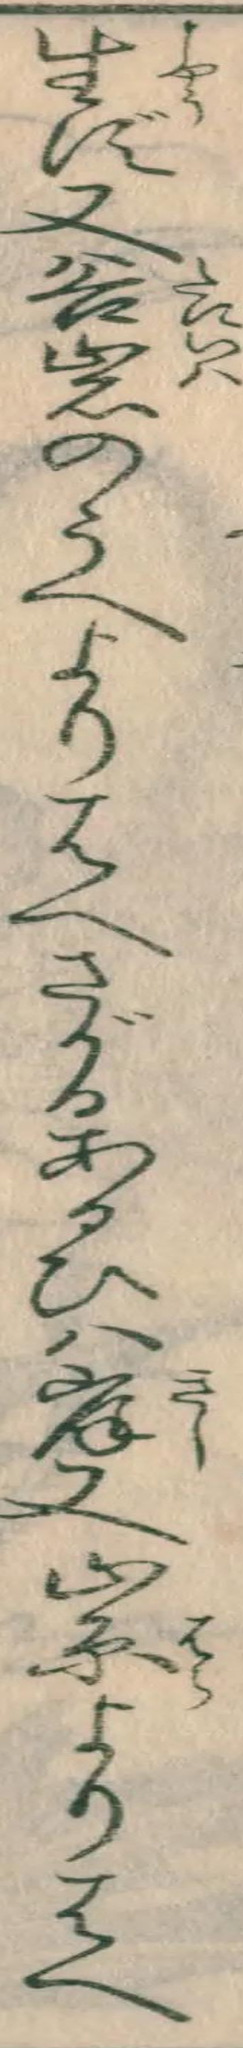生ず又谷岩のうへよりはへさがるあるひは岸又山原よりはへ
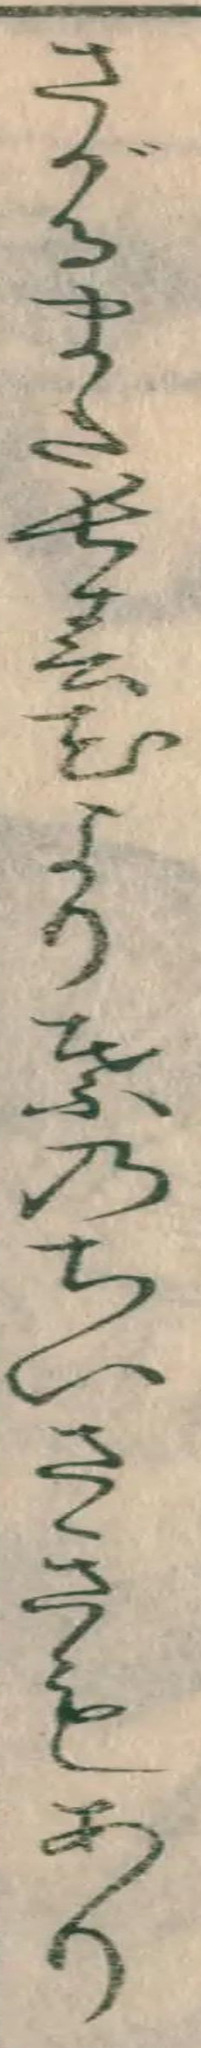さがるまた長春花より葉のちいさきもあり
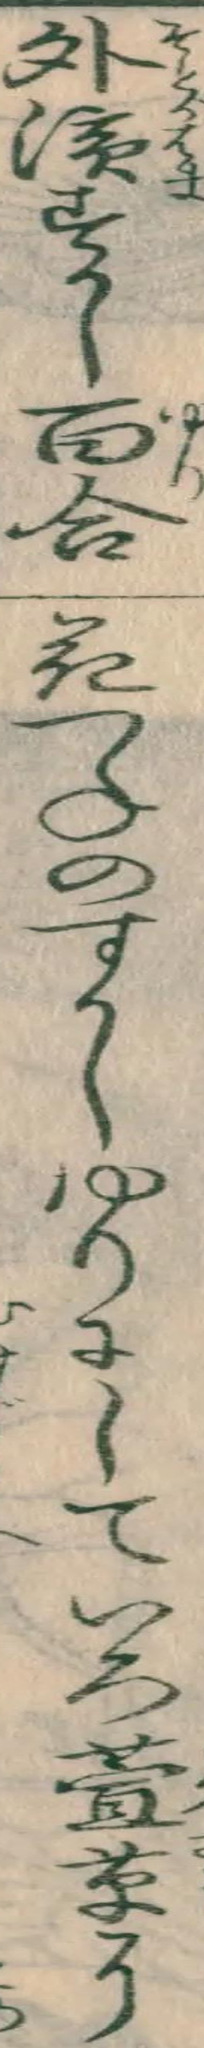[外浜すかし百合]花つねのすかしゆりにしていろ萱草に
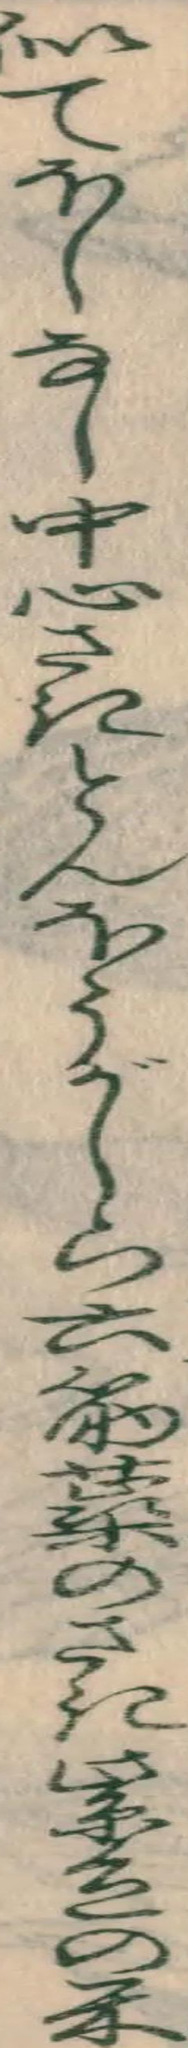似てほしなし中心さきとんほうがしら六筋蕊のさき紫色の米
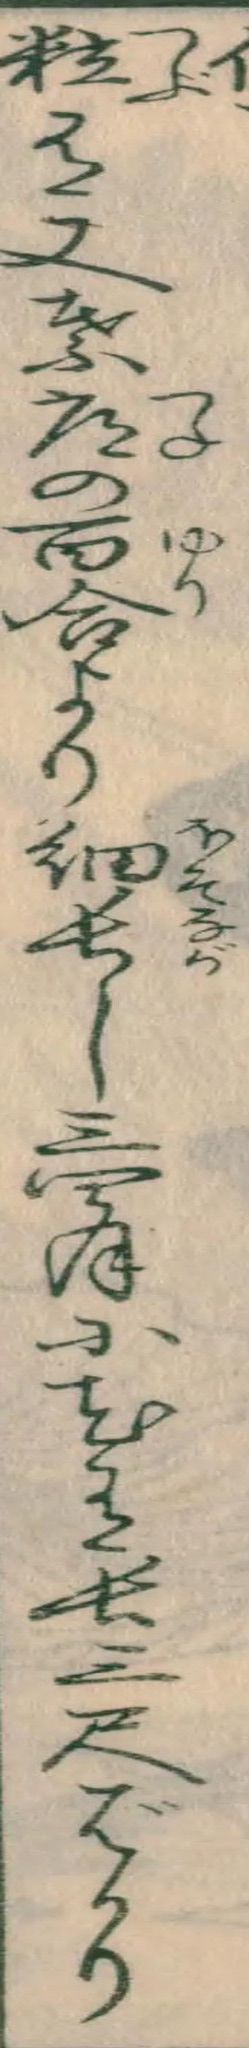粒有又葉常の百合より細長し三四月に花有長三尺ばかり
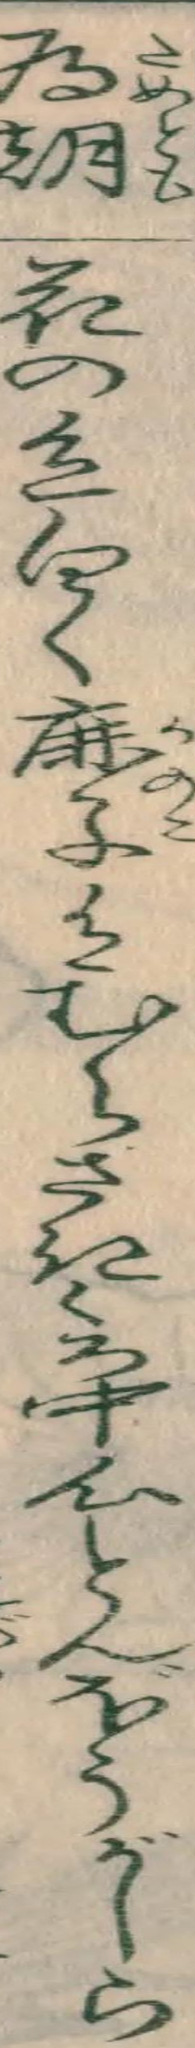花の色白く鹿子有むらさきくろ中心とんぼうがしら
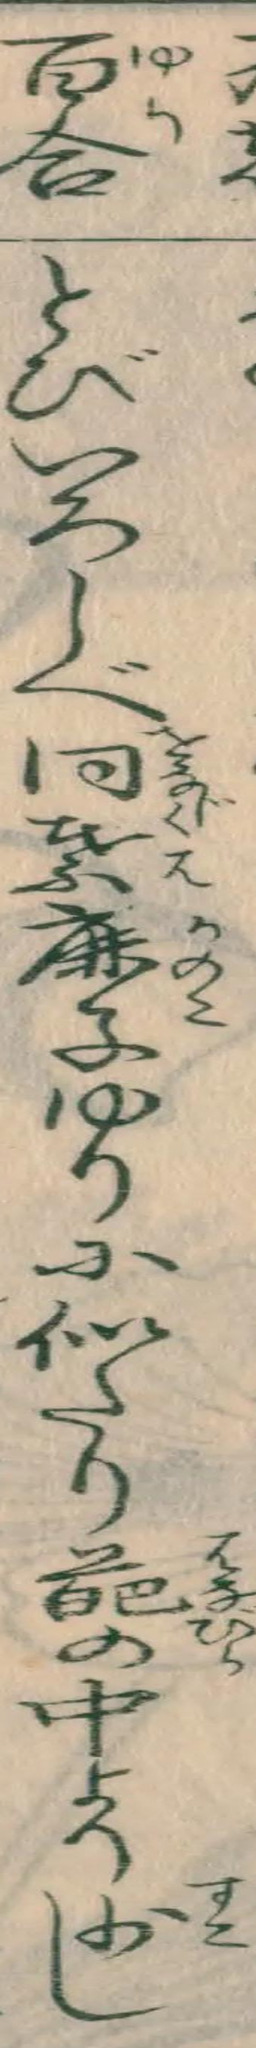とびいろしべ同葉鹿子ゆりに似たり葩の中より少し
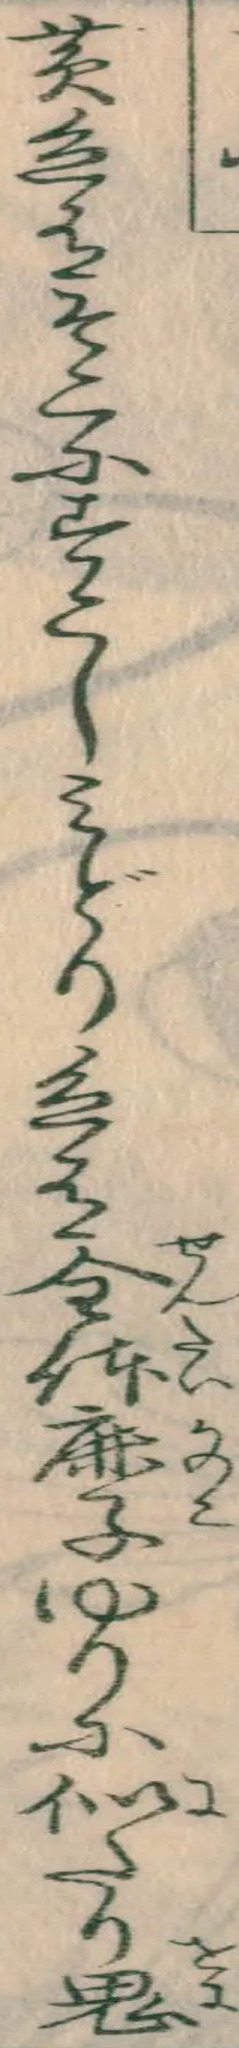黄色有そこにすこしみどり色有全体鹿子ゆりに似たり鬼
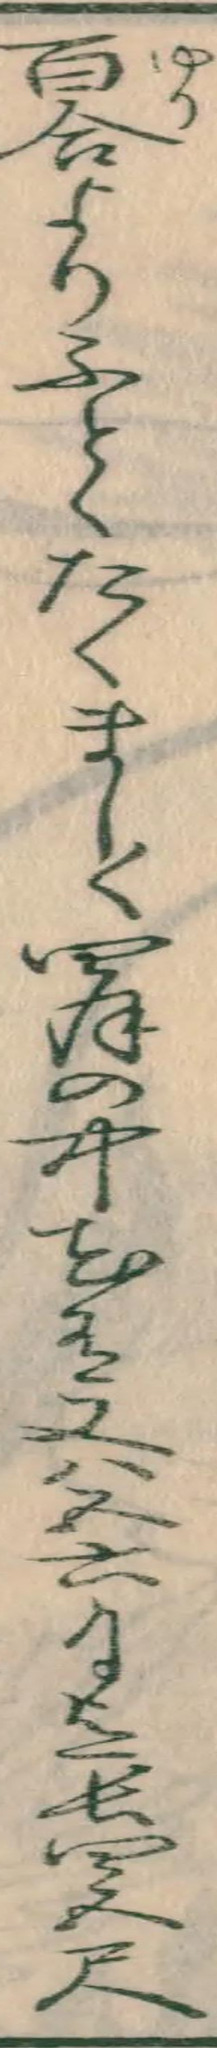百合よりふとくたくましく四月の中花有又は五六月迄長四五尺
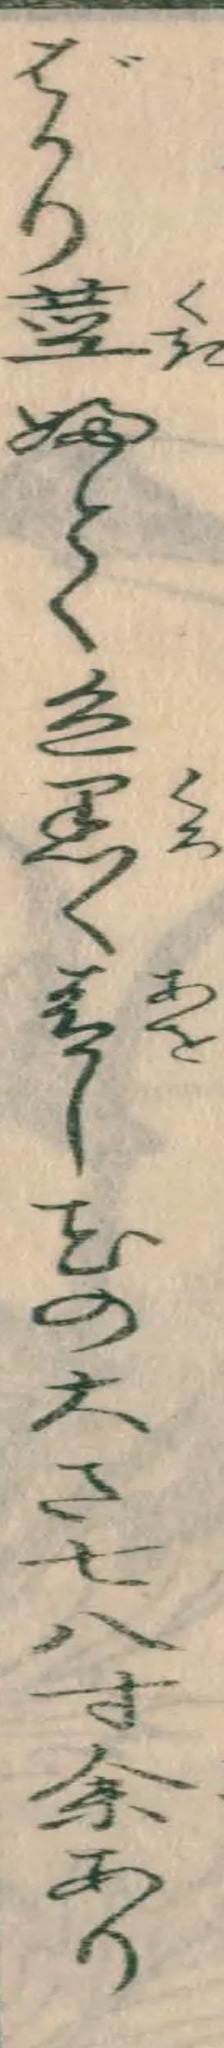ばかり茎ふとく色黒く青し花の大さ七八寸余あり
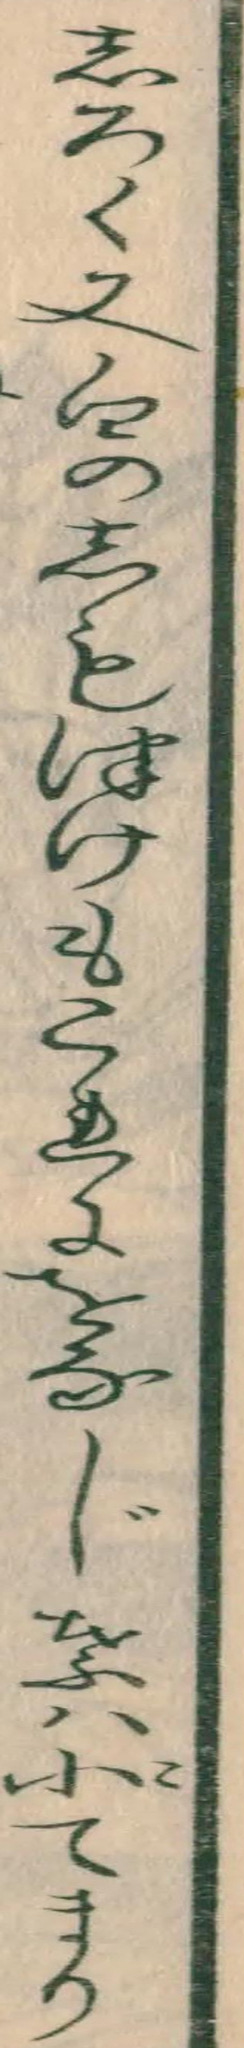しろく又白のしもつけもこれにをなじ葉は小てまり
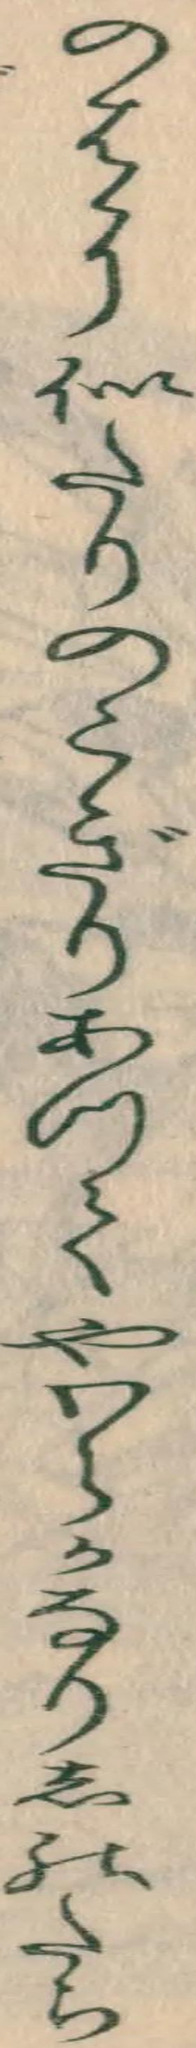のはに似たりのこぎりあつてやわらかなりしのたち
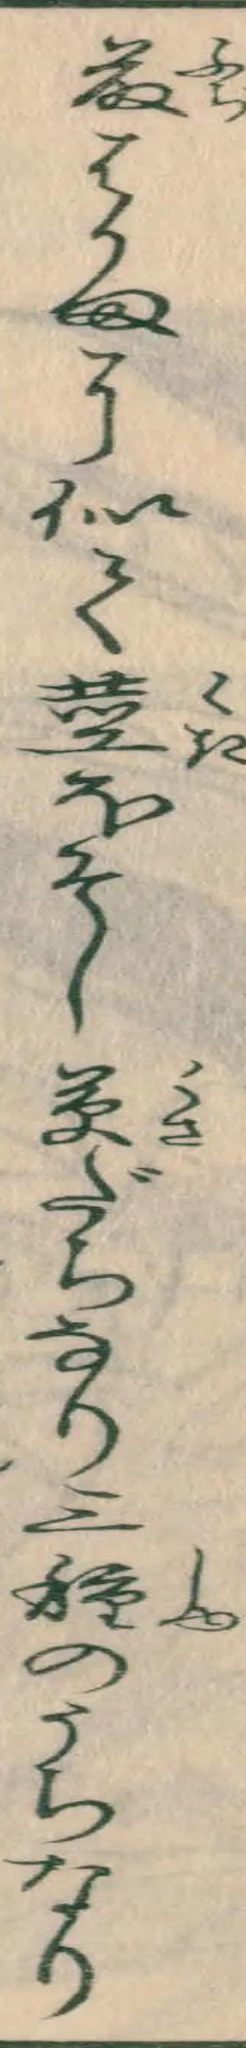藤はかまに似て茎ほそし草だちなり三種のうちなり
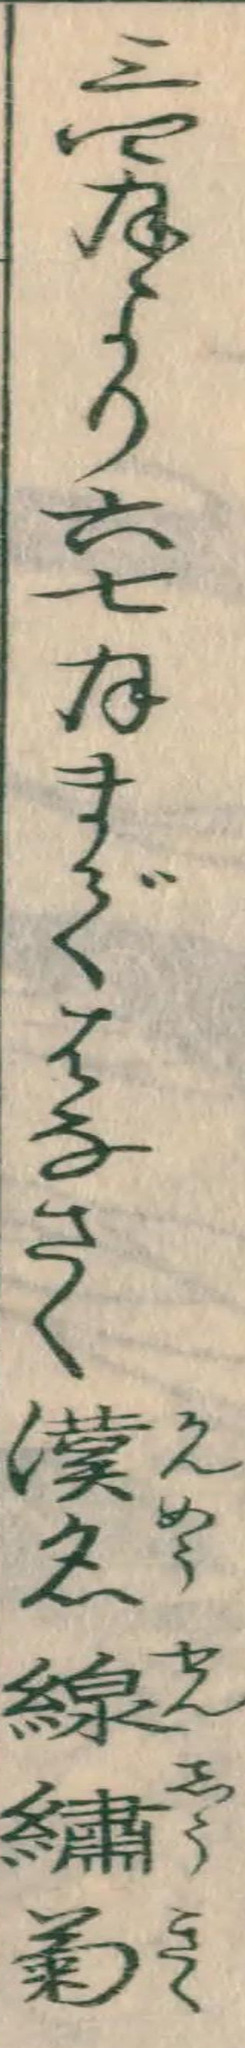三四月より六七月まではなさく漢名線繍菊
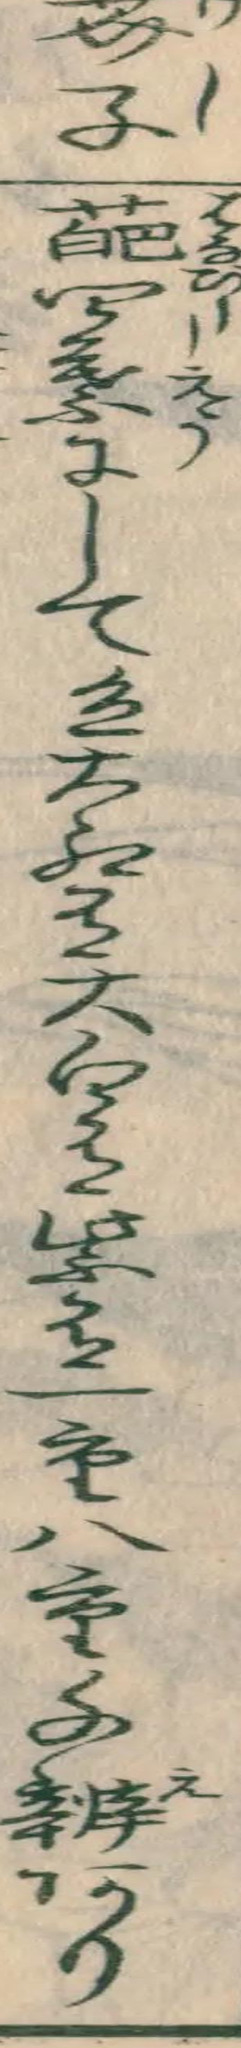葩四葉にして色大紅有大白有紫有一重八重千弁あり
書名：畫本野山草. [4]
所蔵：国立国会図書館 National Diet Library, JAPAN
